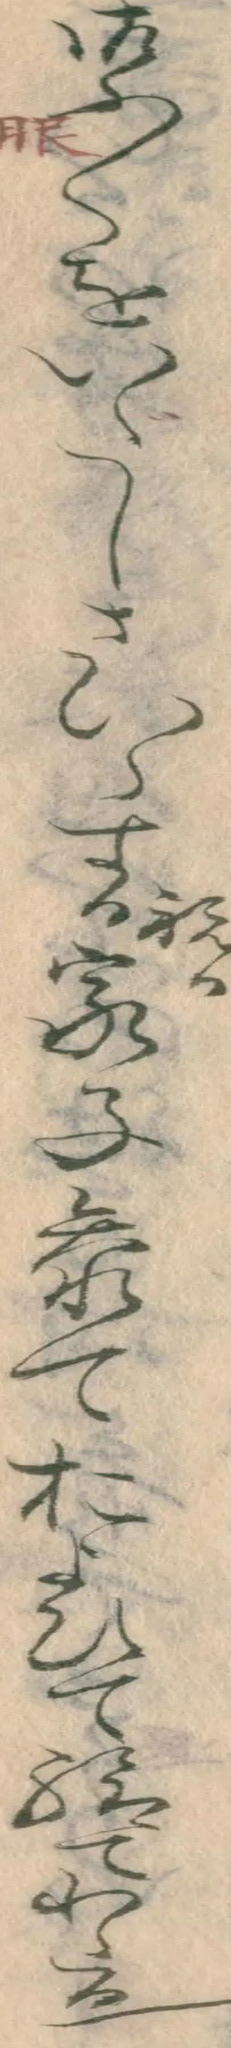御ふくをいだしまいらする家子参ておよひて給てわたる
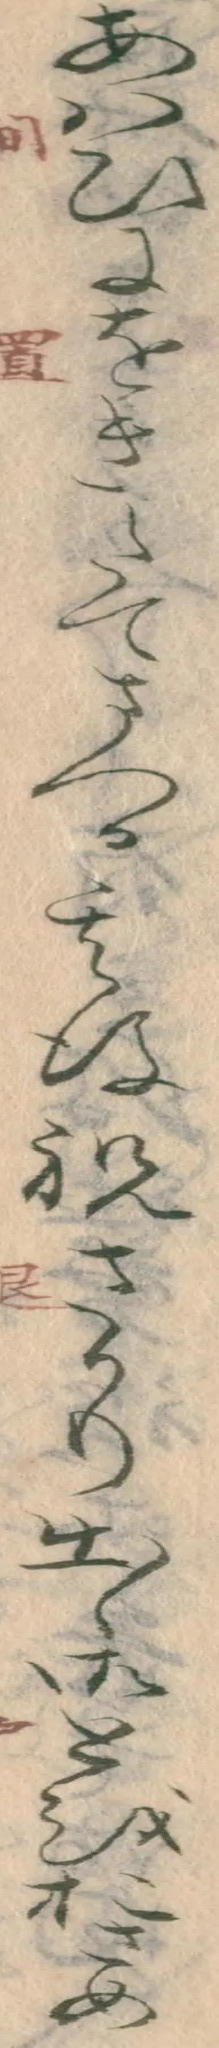あはひにをきたてまつる其後祝さかり出し御とをおさめ
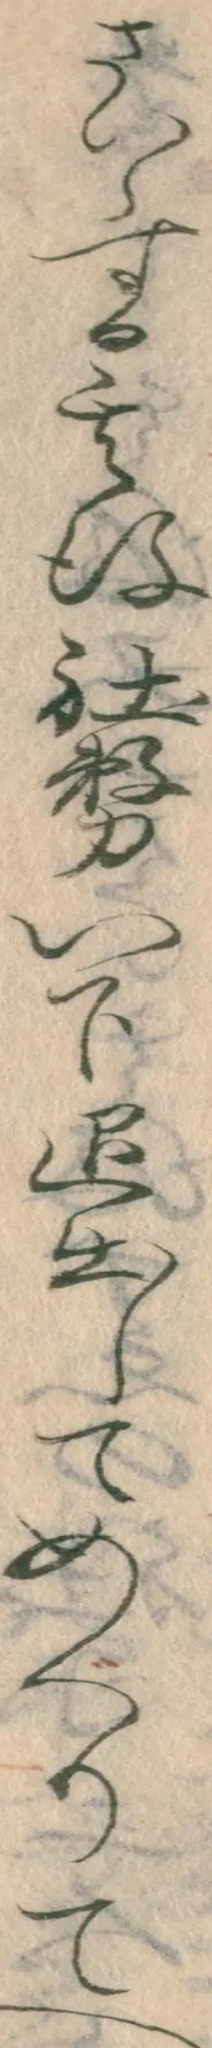まいらする其後社務い下退出してめぐりて
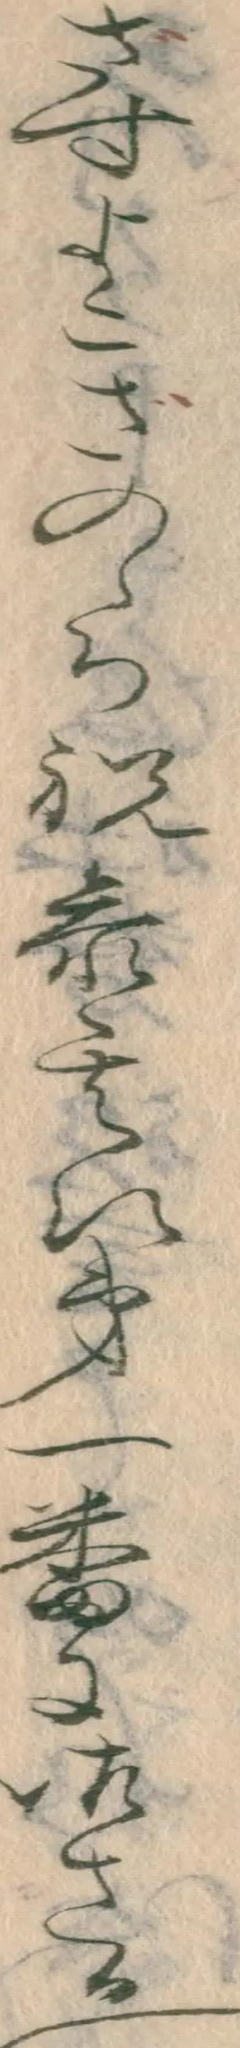ざすよこざのゝち祝参其次第一番に御さる
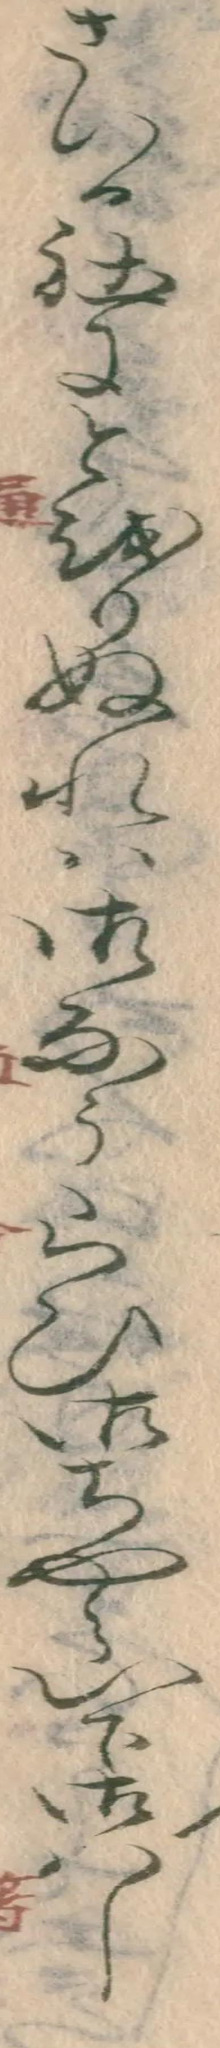まいる社にとをりぬれは御なうらひ御ちやうい下御はし
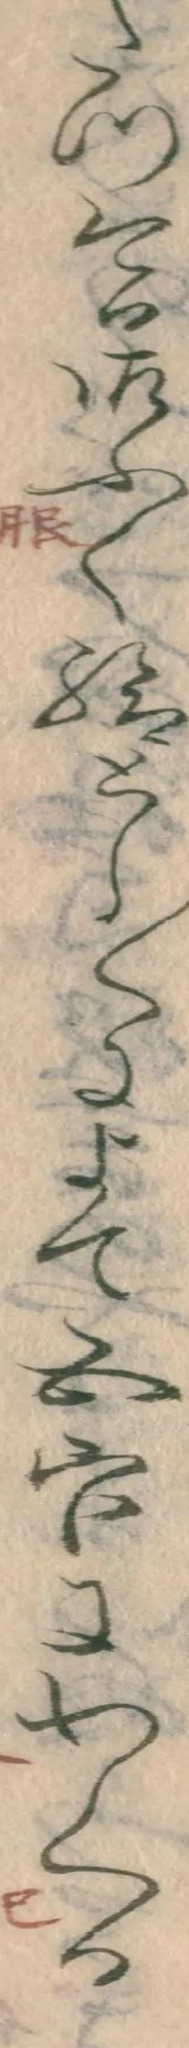たつ今日御ふく給とし〳〵によて五官にわくる
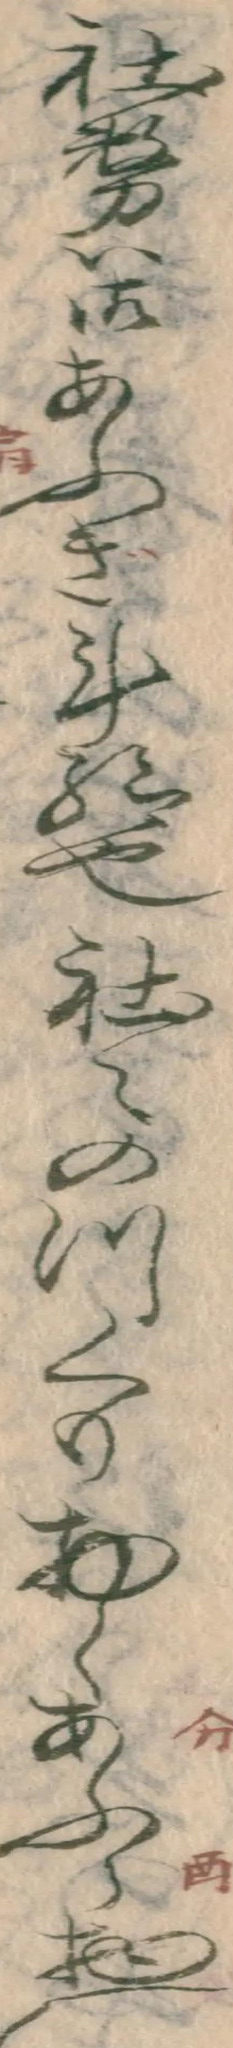社務は御あふぎ計給也社々のつくり物しあふら物
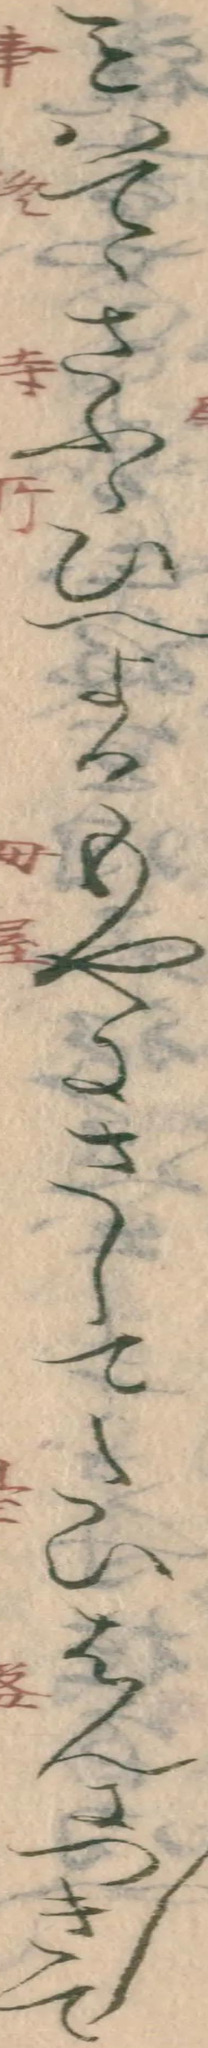ことはてゝさふらひへよるもやにさしてたいはんにつきて
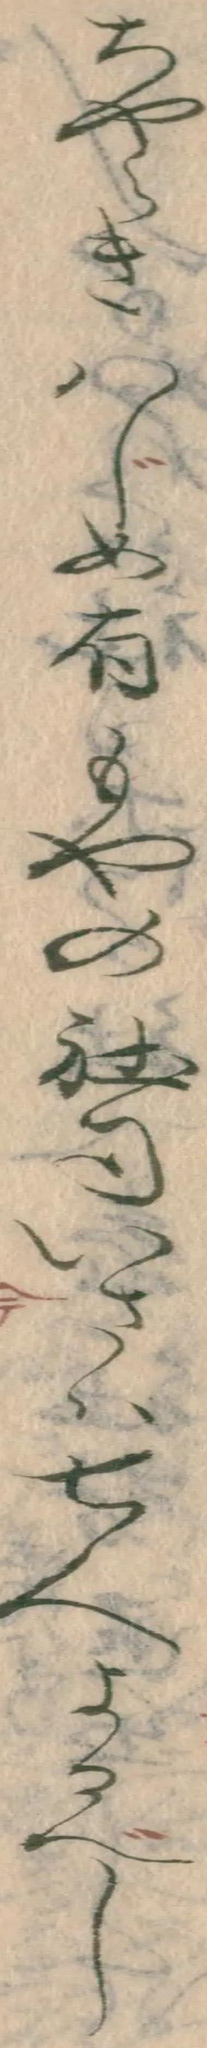ちやうきはじめ有もやの社司いまは七人よるべし
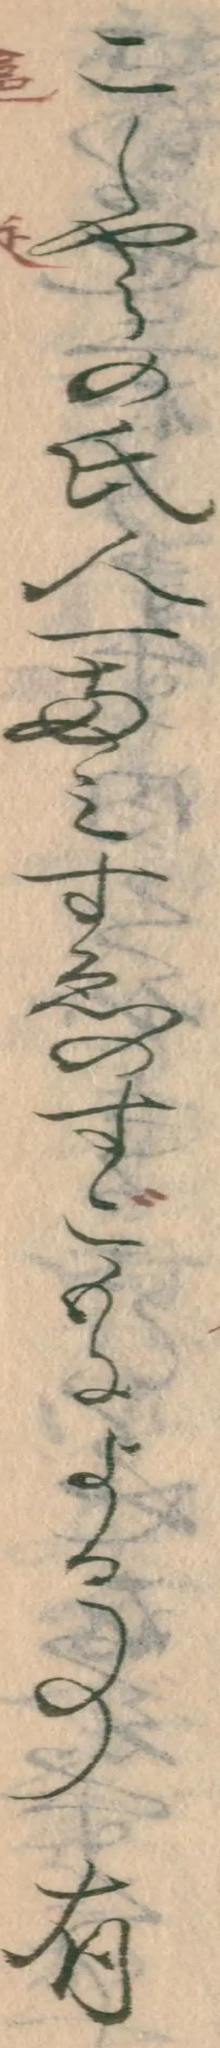こしやうの氏人一両みすゑのすごもによる事有
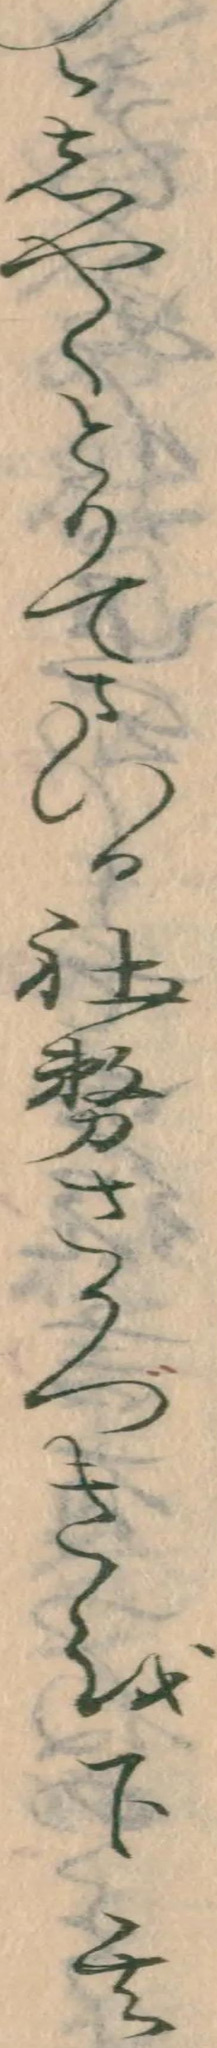しやくとりてまいる社務さかづきを下其
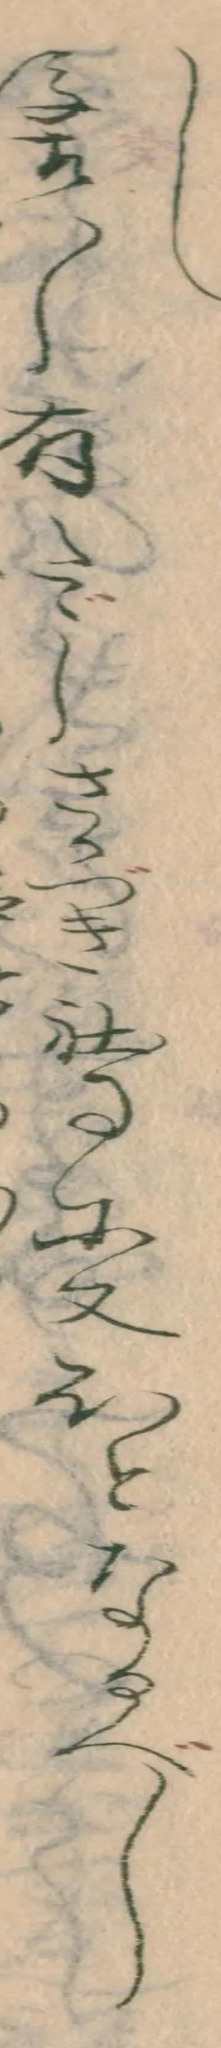後御はし有たゞしさかづき社司に又ほとなるべし
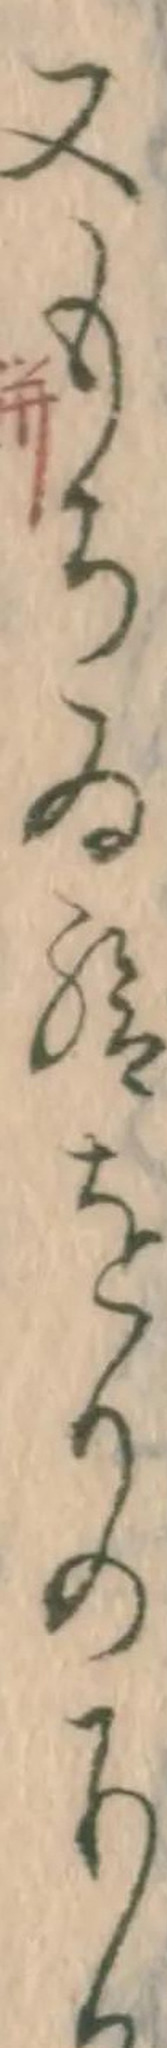又もちゐ給をりの下る
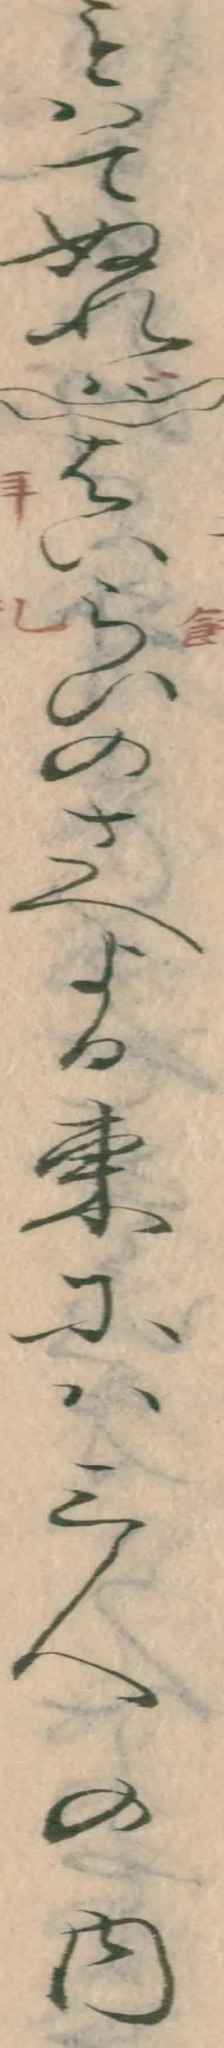ことはてぬればはいらいのさへよる東には三人の内
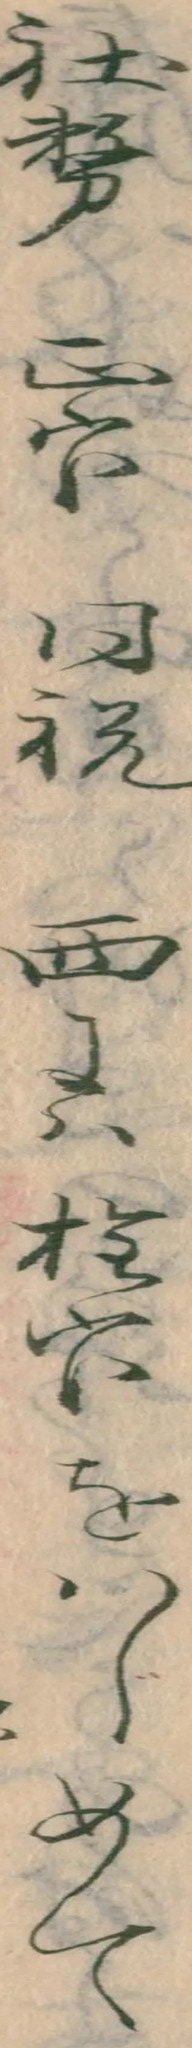社務正官同祝西には権官をはじめて
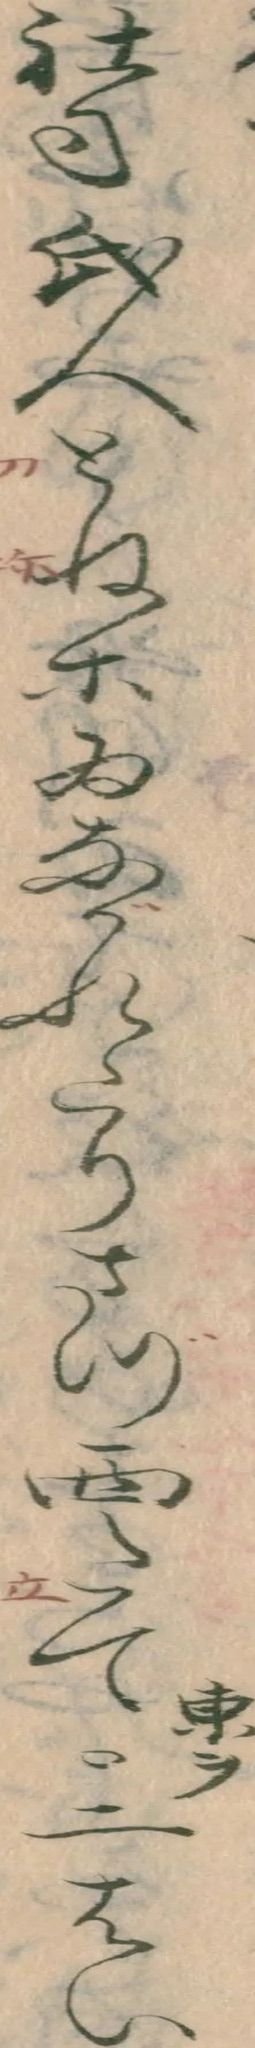社司氏人とね等ゐながれたりまづ西たて◦二はい
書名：賀茂社記録. 第3冊
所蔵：国立国会図書館 National Diet Library, JAPAN
